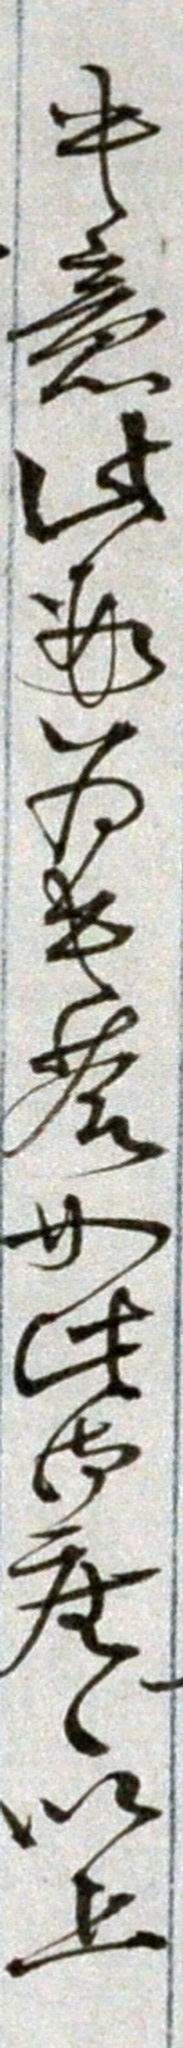貴意此段為貴答如此御座候以上
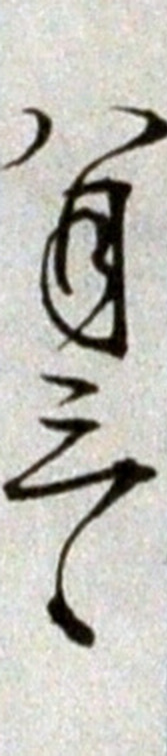八月三日
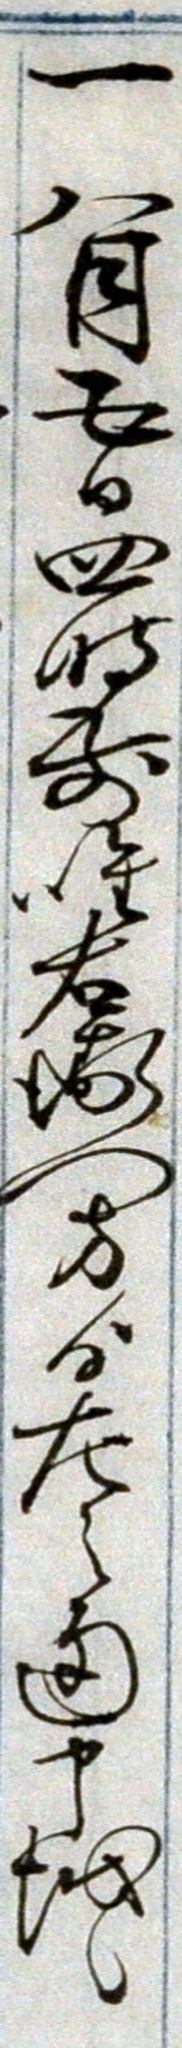一八月五日四時前唯右衛門方ゟ左之通申越候
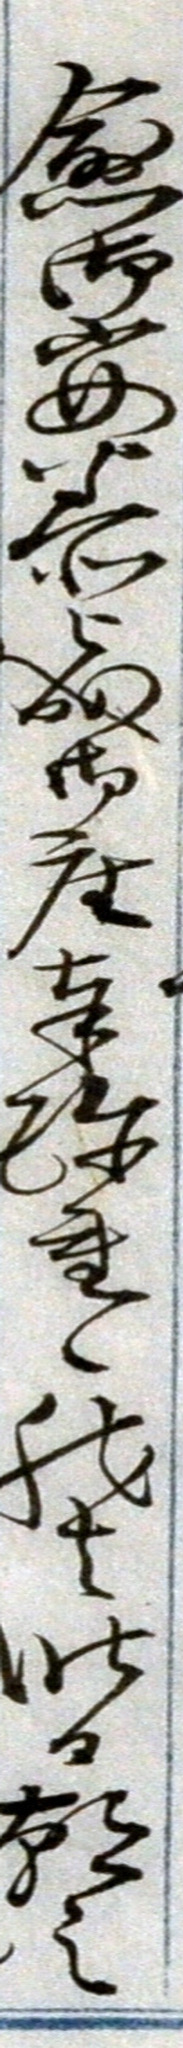愈御安泰被成御座奉珍重候然者昨日朝之
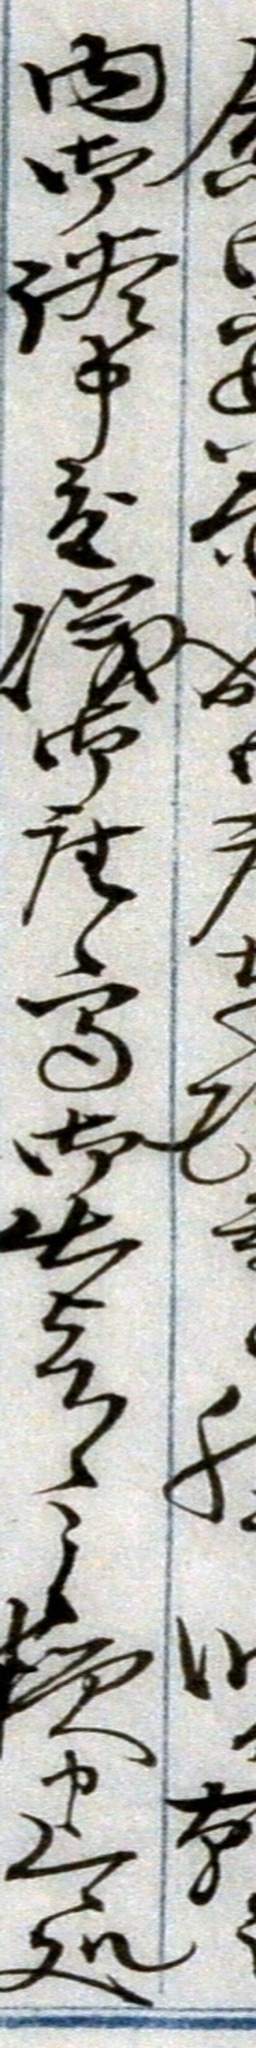内御談申度儀御座候間御出被下候之様申上候処
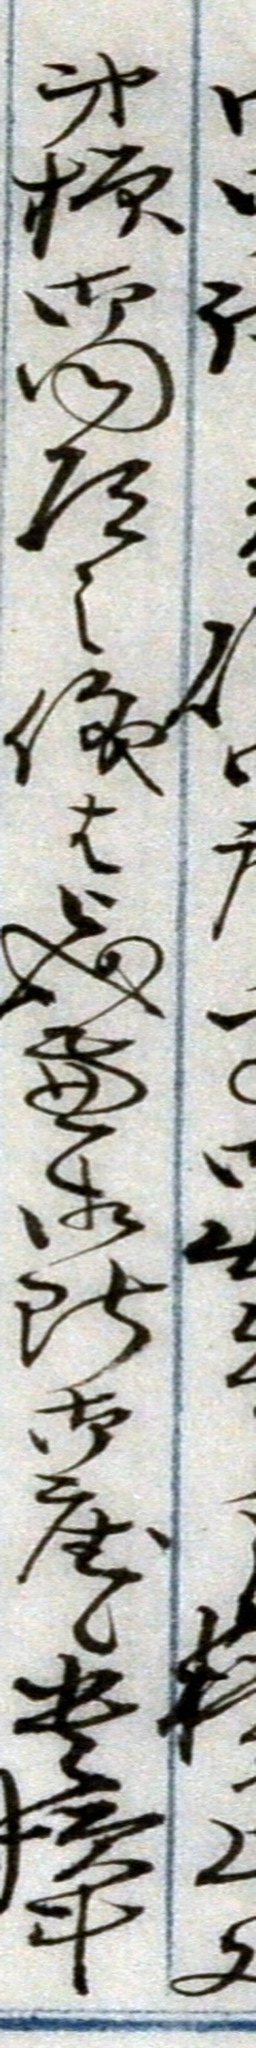弟様御同道之儀者被成兼御断御座候貴様斗
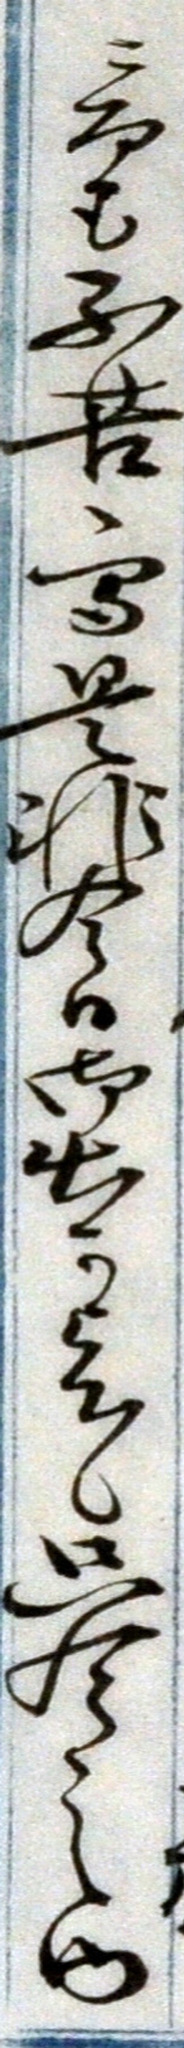ニ而も不苦候間是非今日御出可被下候只今之内
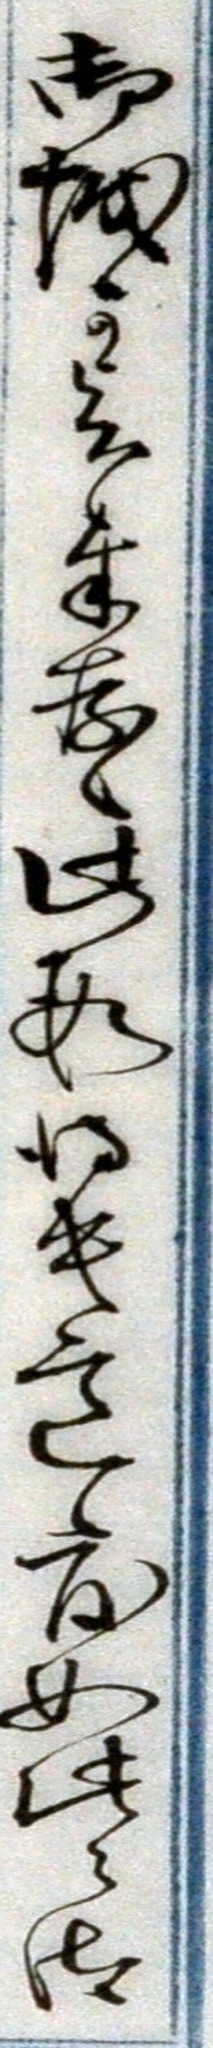御越可被下奉存候此段得貴意度如此ニ御
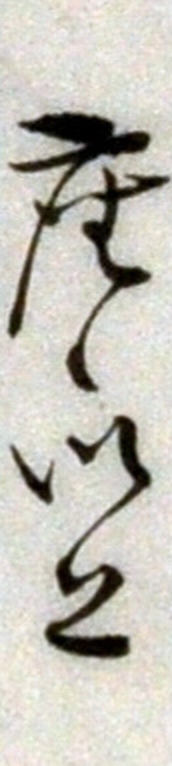座候以上
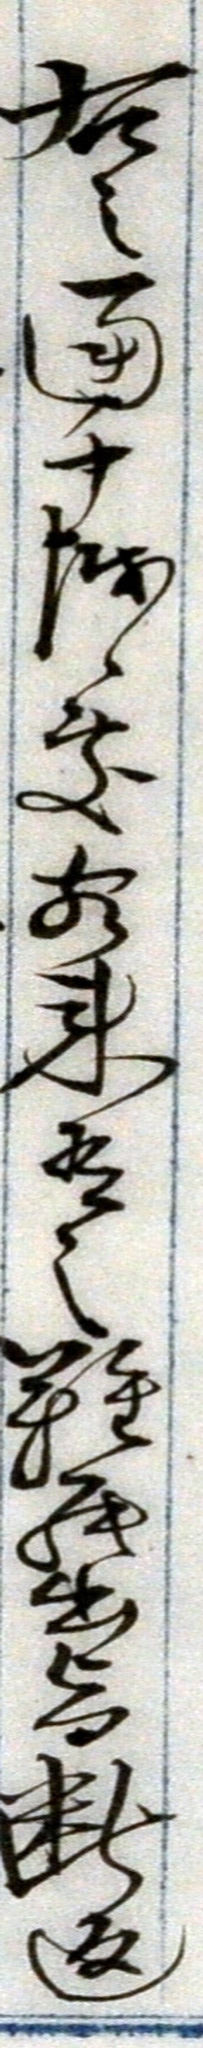右之通申越候處客来有之難罷出旨断返
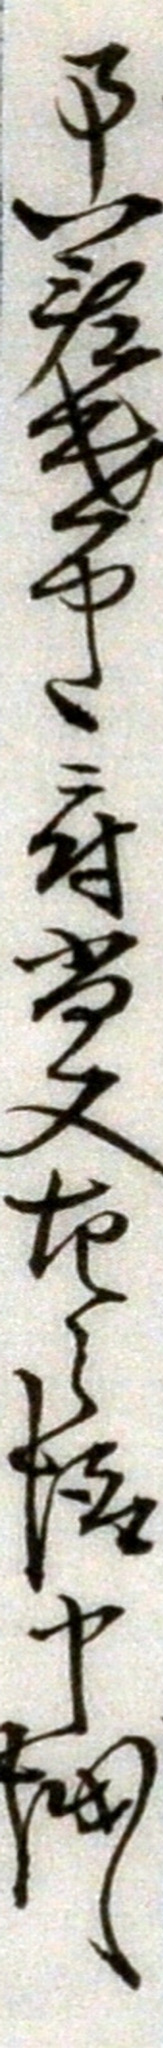事差遣申候ニ付尚又左之趣申越候
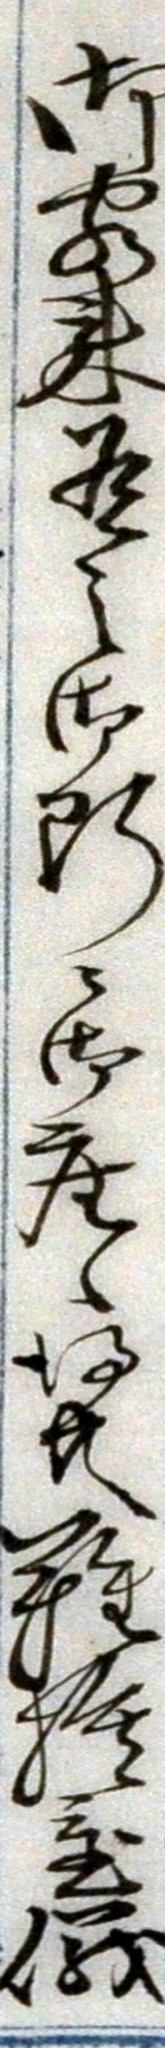御客来有之御断ニ御座候得共難捨置儀
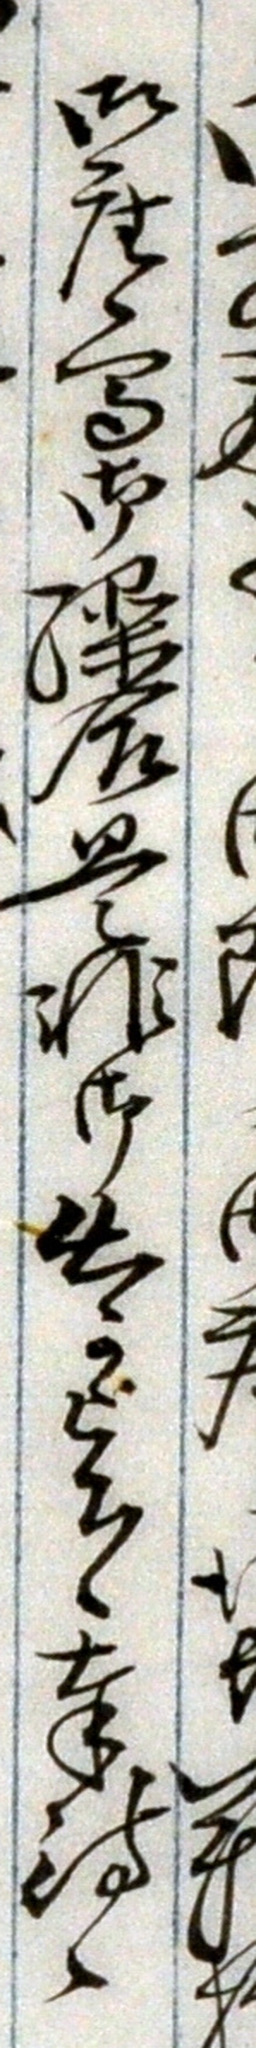御座候間繰合是非御出可被下候奉待候
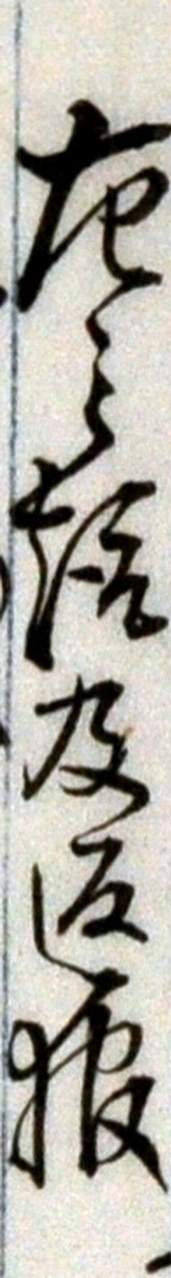左之趣及返報
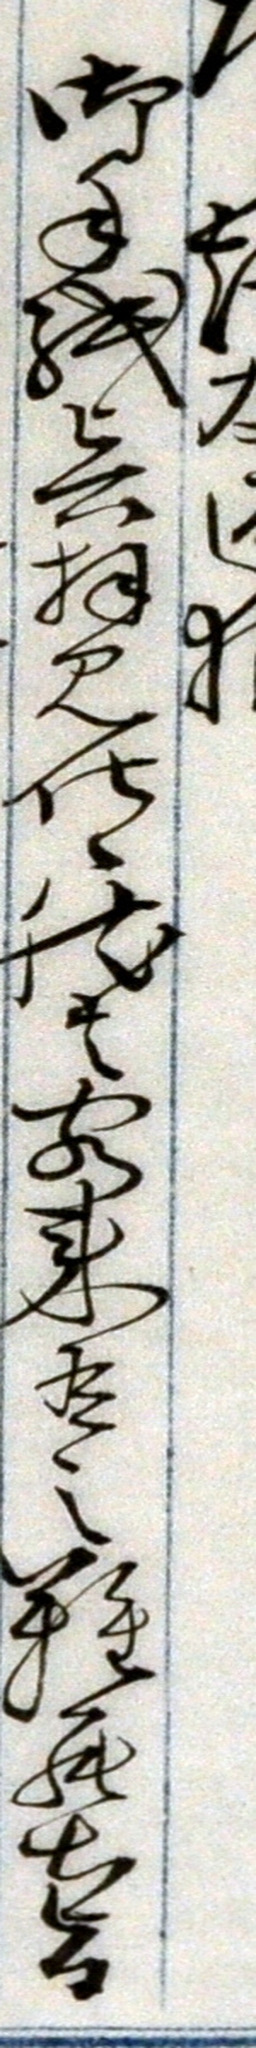御手紙被下拝見仕候然者客来有之難罷出旨
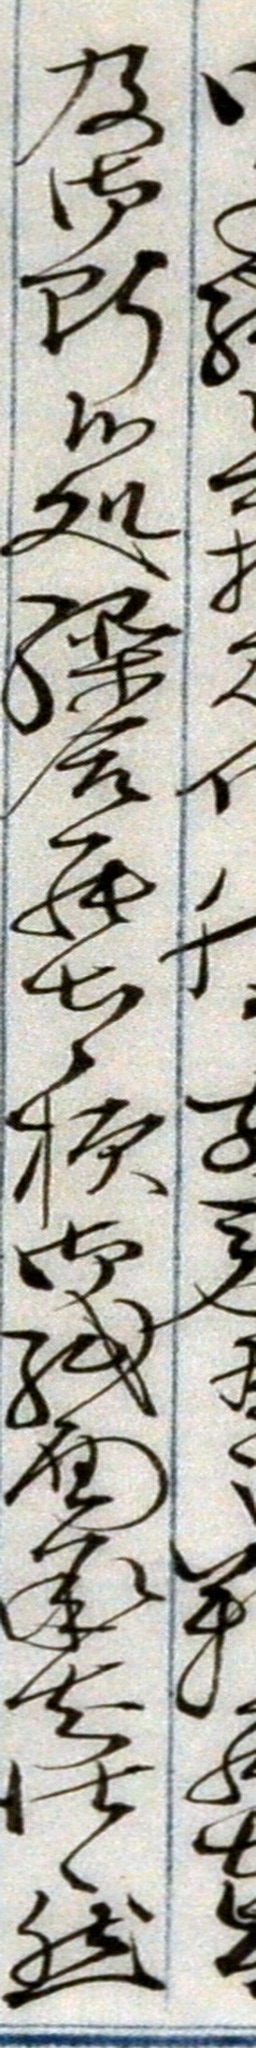及御断候処繰合罷出候様御紙面承知仕候然
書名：川面小藤太子細有之多賀谷唯右衛門ヲ打果候一件
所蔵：伊那市立高遠町図書館・合同会社AMANE
